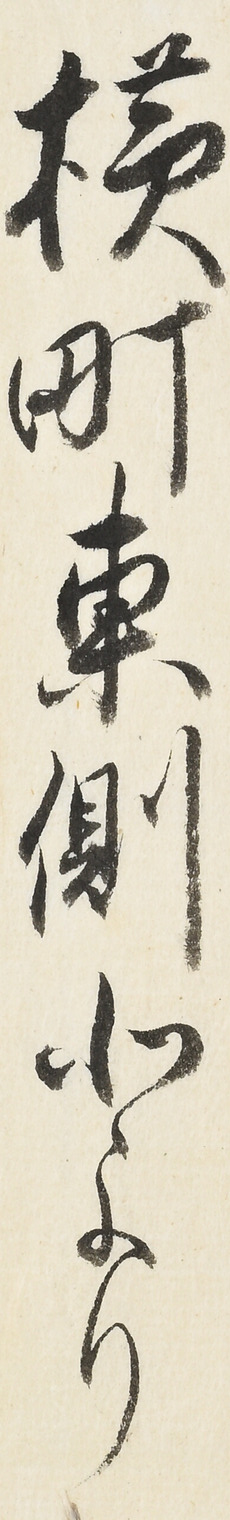横町東側北より
